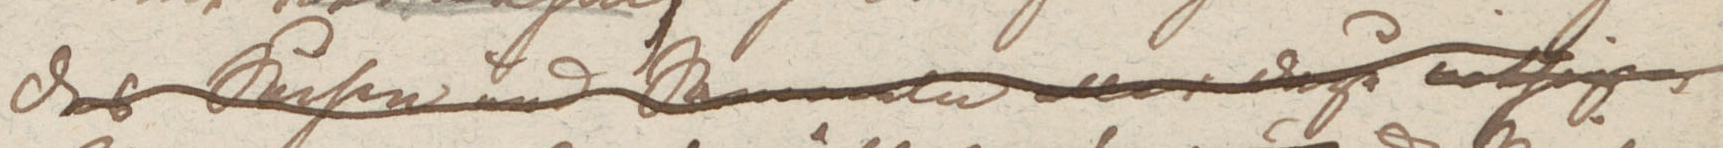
das Suchen und Sammeln aller dazu nöthigen
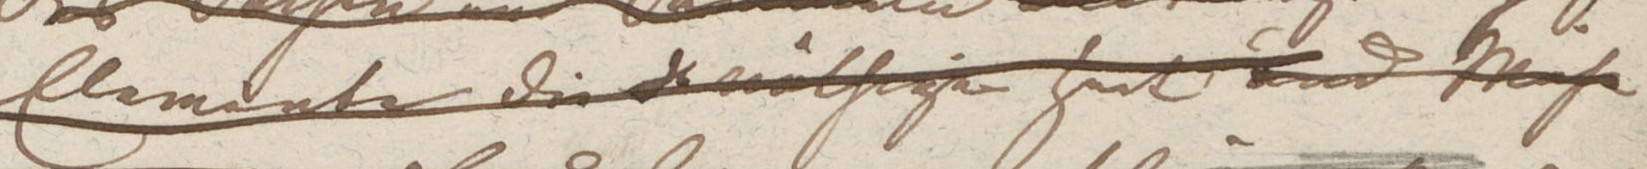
Elemente die nöthige Zeit und Mühe
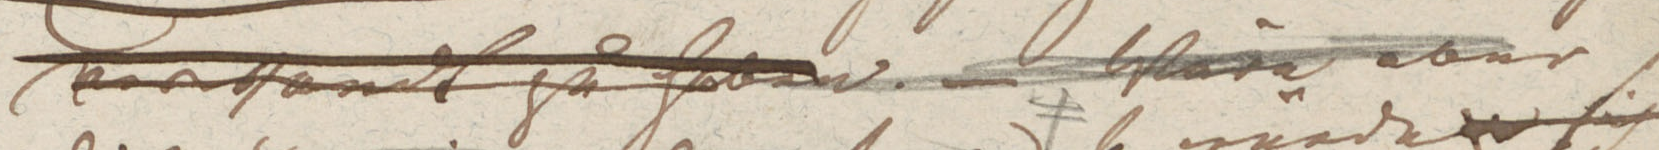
verwandt zu haben. – Wäre aber
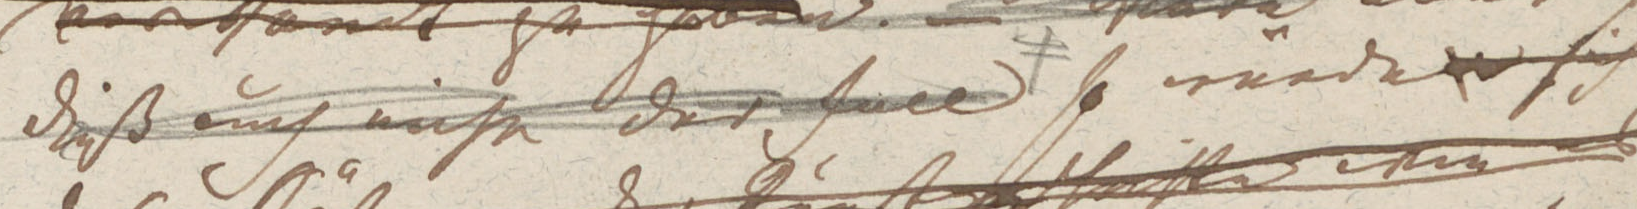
diess auch nicht der Fall% so würden sich
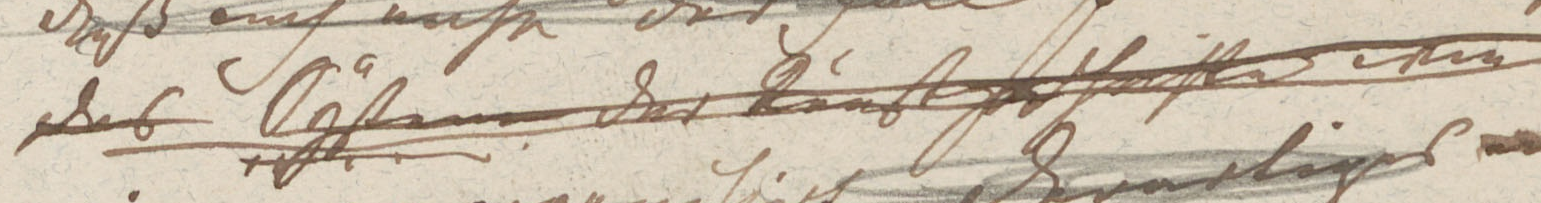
das System der Kunstgeschichte wie es
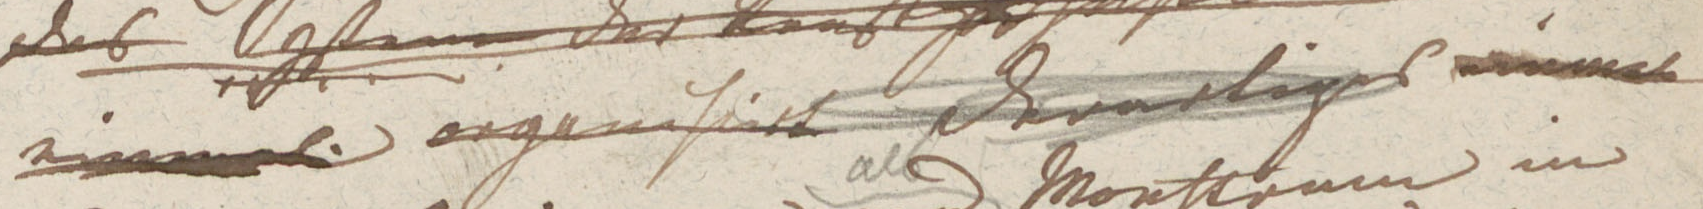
einmal organisirt Derartiges einmal
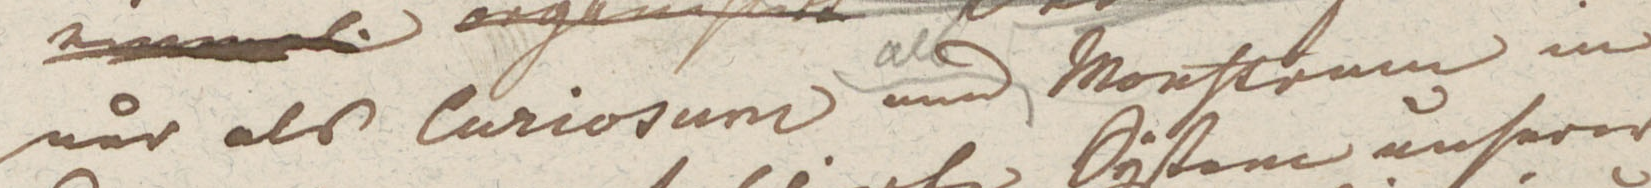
nur als Curiosumund als Monstrum in
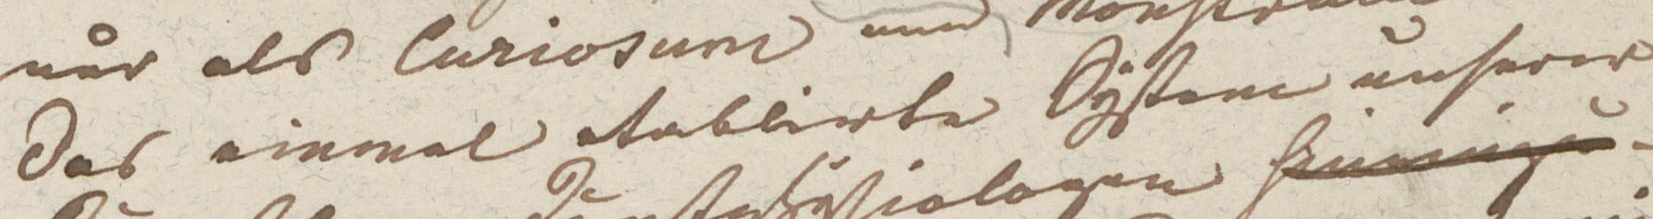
das einmal etablirte System unserer
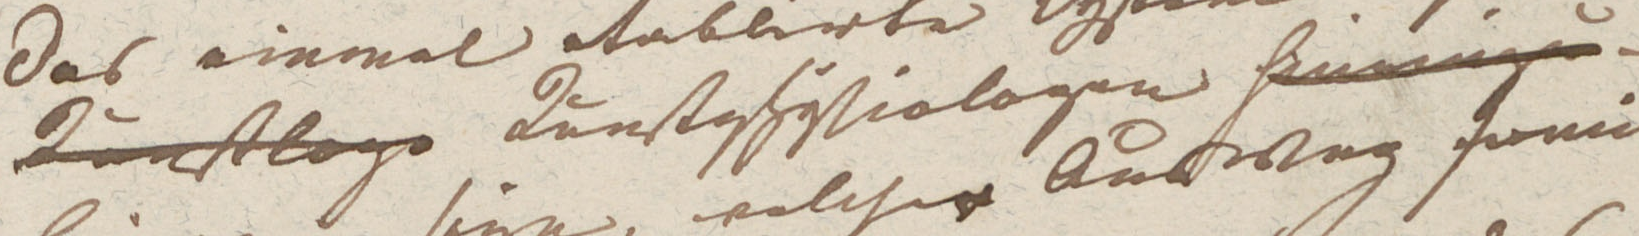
Kunstlogo Kunstphysiologen hineinzu-
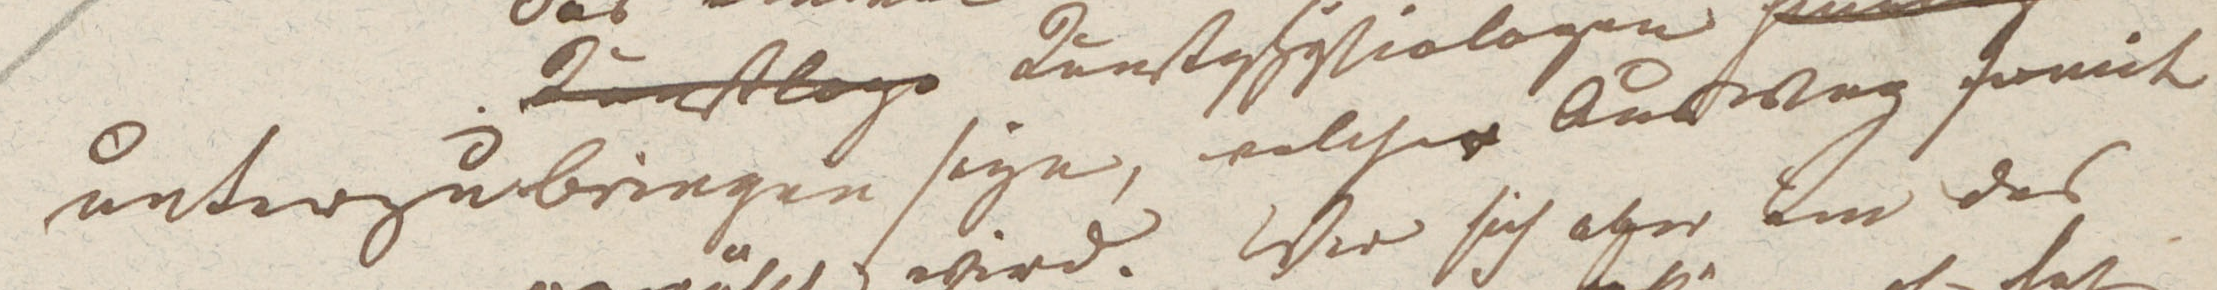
unterzubringen seyn, welcher Ausweg somit
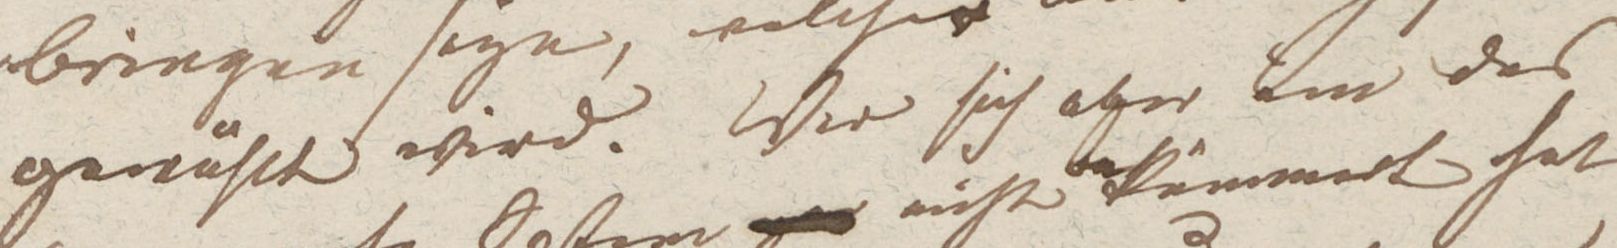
gewählt wird. Wer sich aber um das
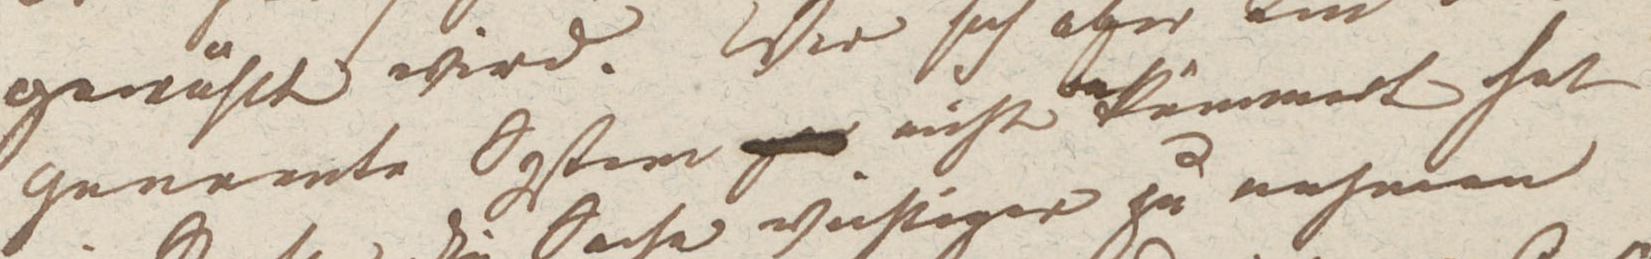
genannte System gar nicht bekümmert hat
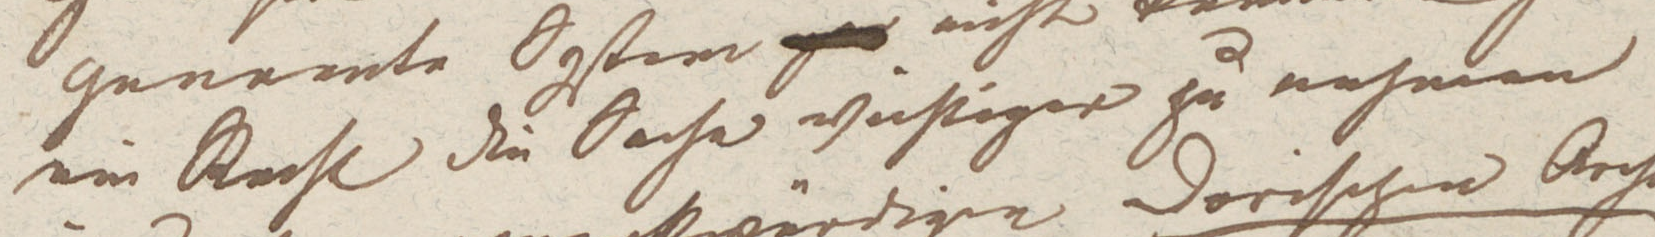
ein Recht die Sache wichtiger zu nehmen
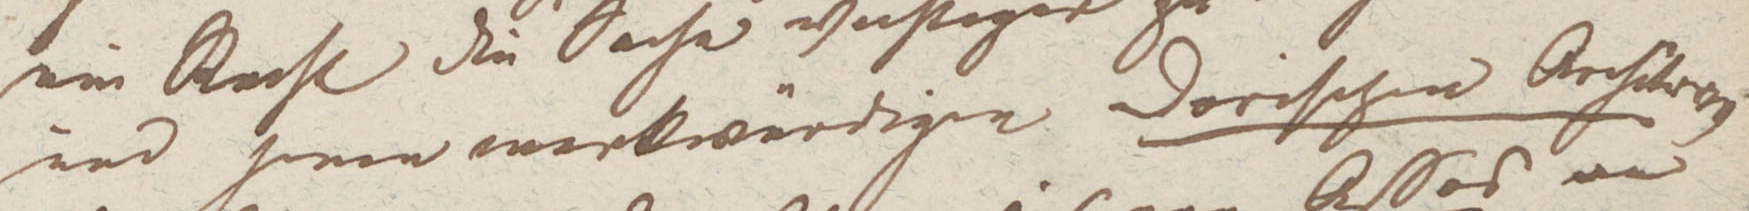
und jenen merkwürdigen Dorischen Architrav
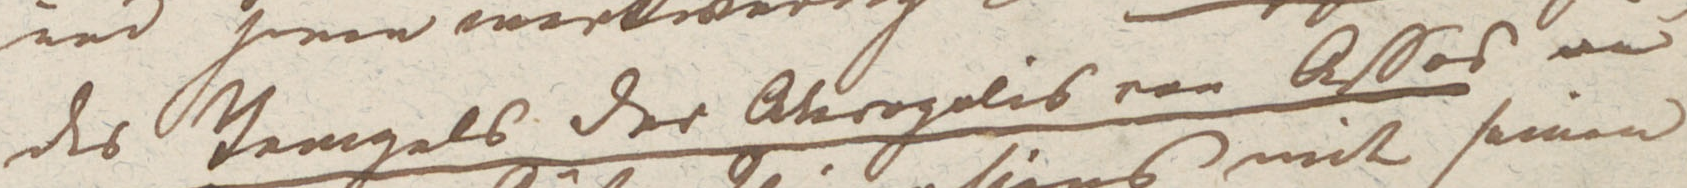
des Tempels der Akropolis von Assos an
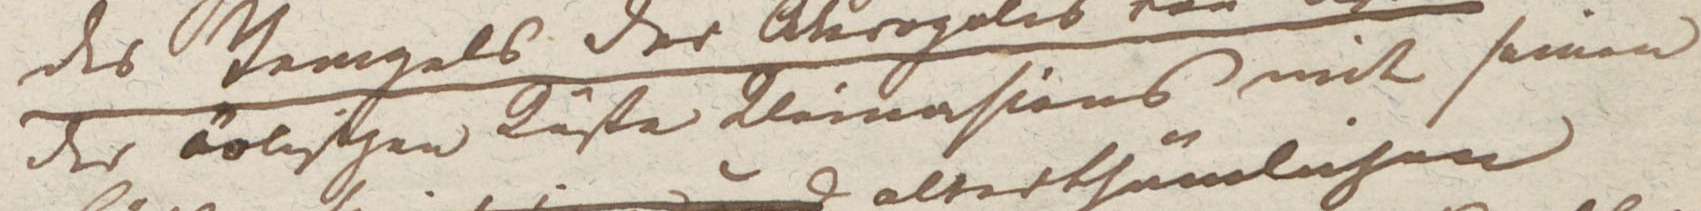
der äolischen Küste Kleinasiens mit seinen
